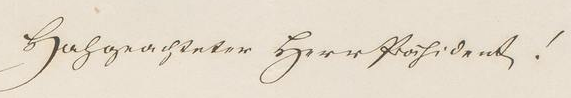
Hochgeachteter Herr Präsident!
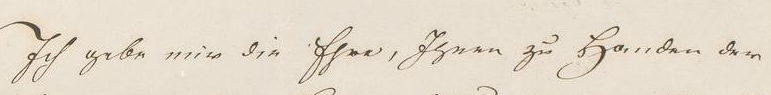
Ich gebe mir die Ehre, Ihnen zu Handen der
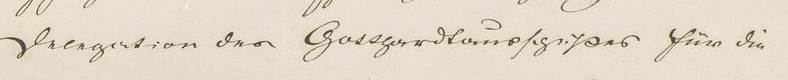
Delegation der Gotthardausschußes für die
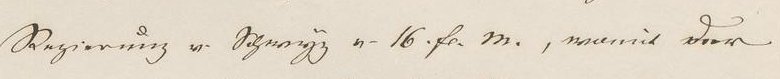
Regierung v. Schwyz v. 16 fl. M., womit der
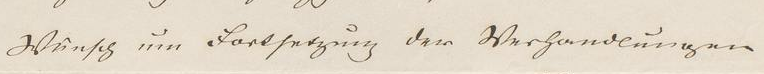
Wunsch um Fortsetzung der Verhandlungen
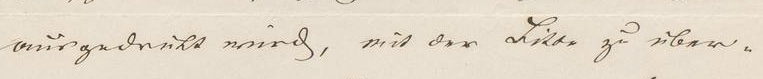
ausgedrückt wird, mit der Bitte zu über-
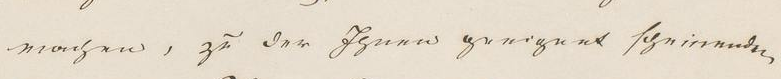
morgen, zu der Ihnen geeignet scheinenden
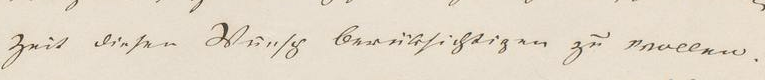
Zeit diesen Wunsch berücksichtigen zu wollen.
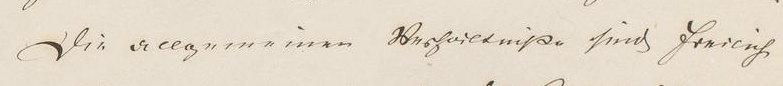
Die allgemeinen Verhältniße sind freilich
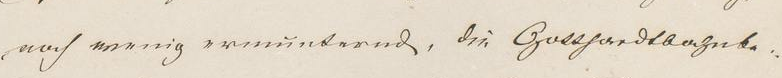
noch wenig ermunternd, die Gotthardtbahnbe-
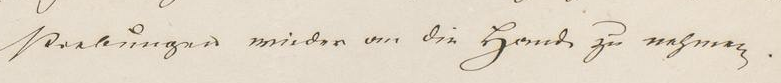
strebungen wieder an die Hand zu nehmen.
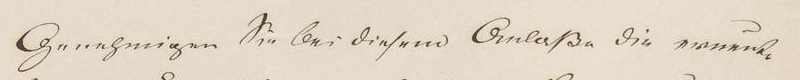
Genehmigen Sie bei diesem Anlaße die erneute
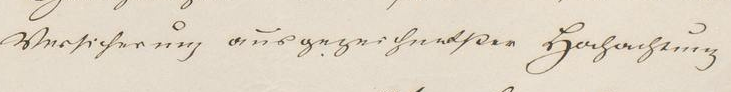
Versicherung ausgezeichnetster Hochachtung
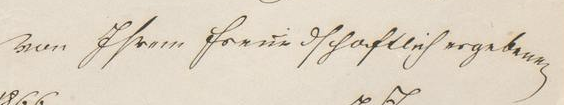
von Ihrem freundschaftlich egebenen
